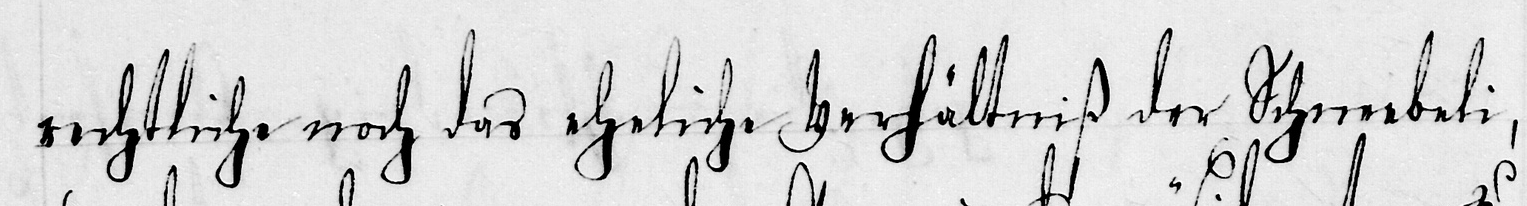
rechtliche noch das eheliche Verhältniß der Schneebeli,
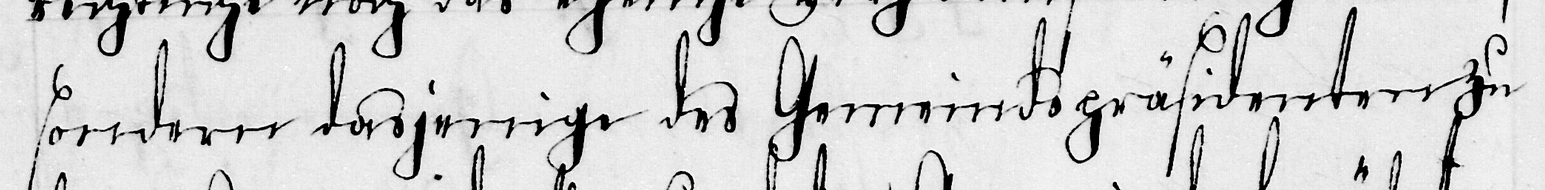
sondern dasjenige des Gemeindspräsidenten zu
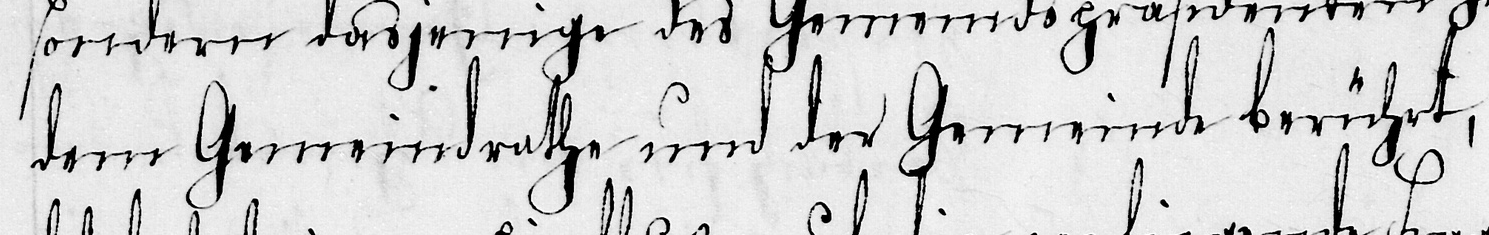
dem Gemeindrathe und der Gemeinde berührt,
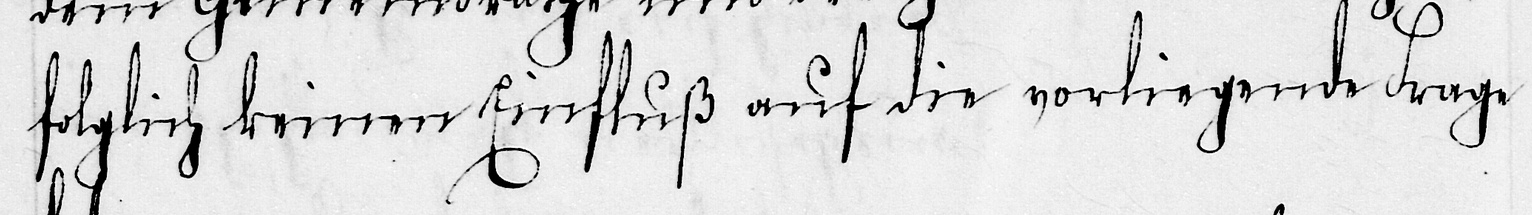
folglich keinen Einfluß auf die vorliegende Frage
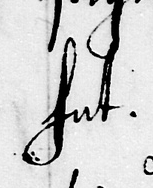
hat.
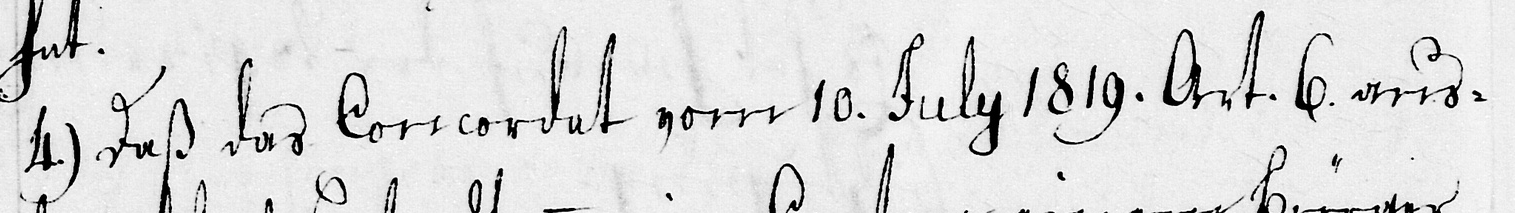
4.) Daß das Concordat vom 10. July 1819. Art. 6. aus¬
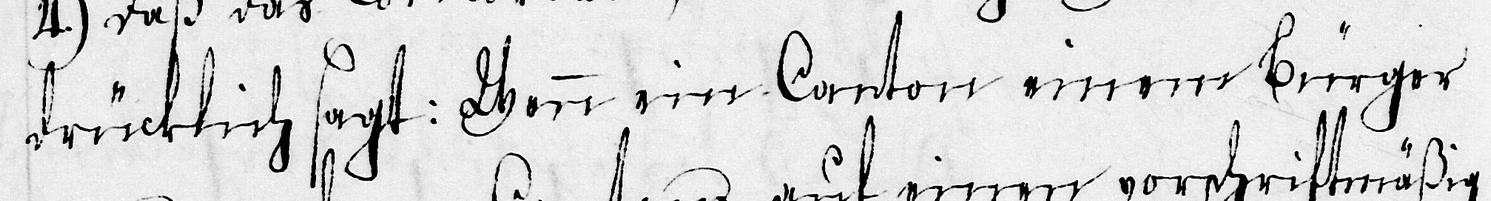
drücklich sagt: Wenn ein Canton einem Bürger
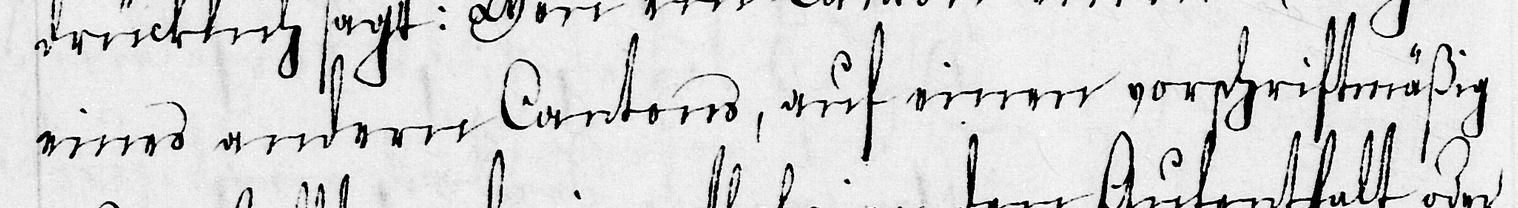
eines andern Cantons, auf einen vorschriftmäßig
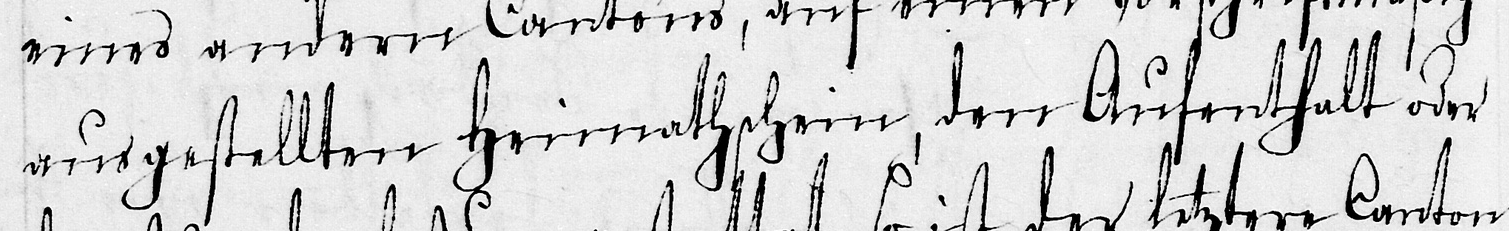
ausgestellten Heimathschein, den Aufenthalt oder
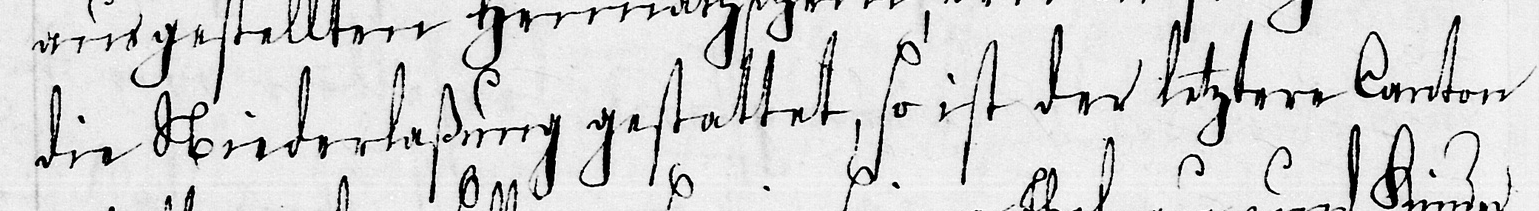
die Niederlaßung gestattet, so ist der letztere Canton
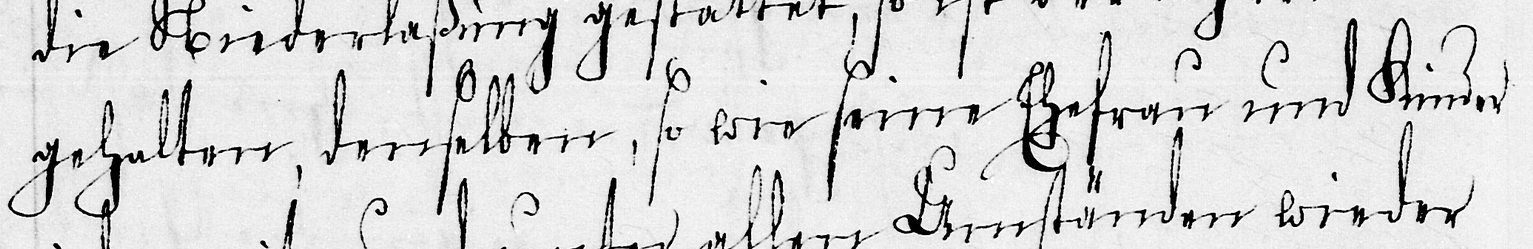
gehalten, denselben, so wie seine Ehefrau und Kinder
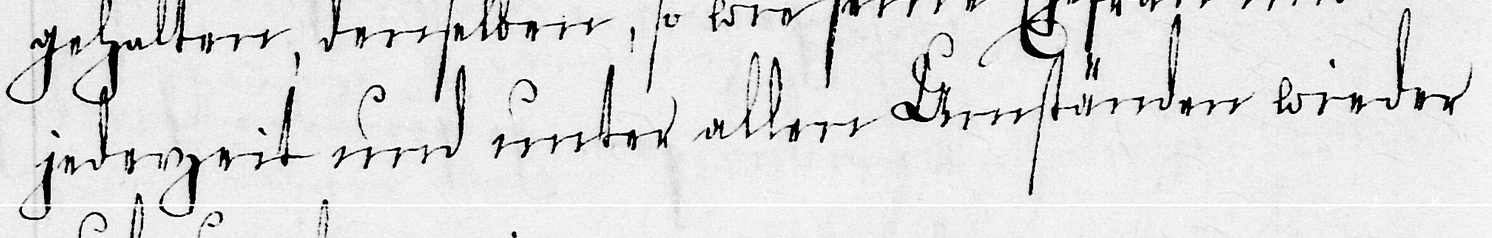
jederzeit und unter allen Umständen wieder
